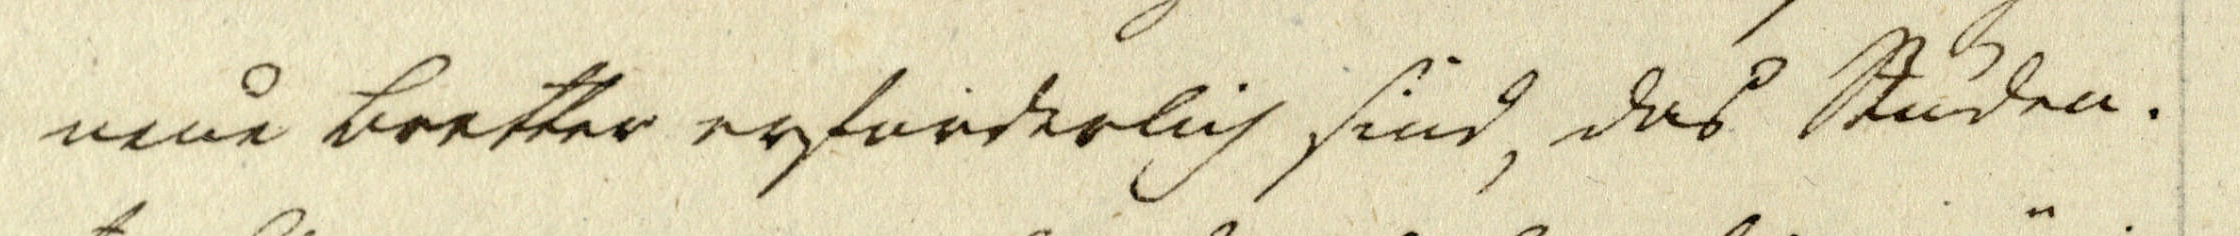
neue Bretter erforderlich sind, das Studen¬
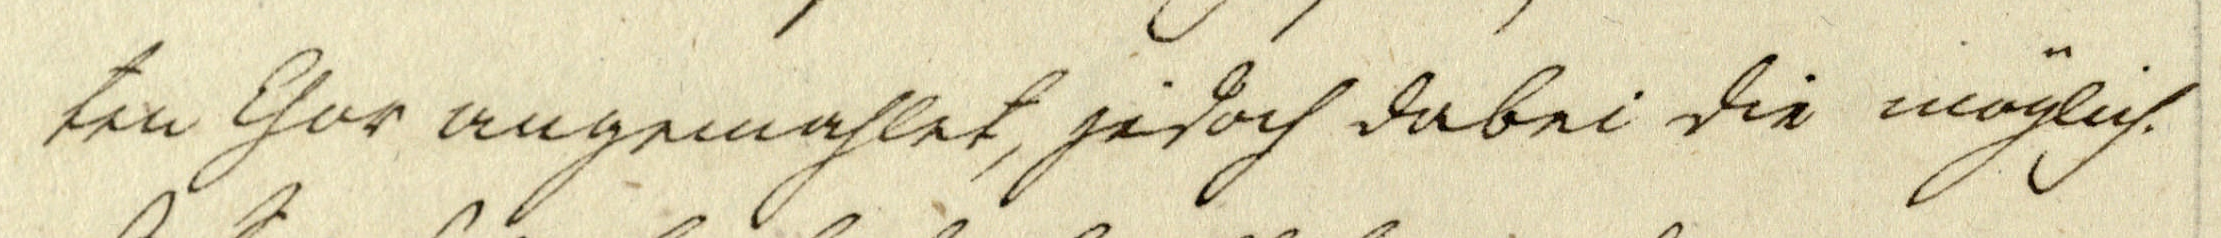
ten Chor angemahlet, jedoch dabei die möglich¬
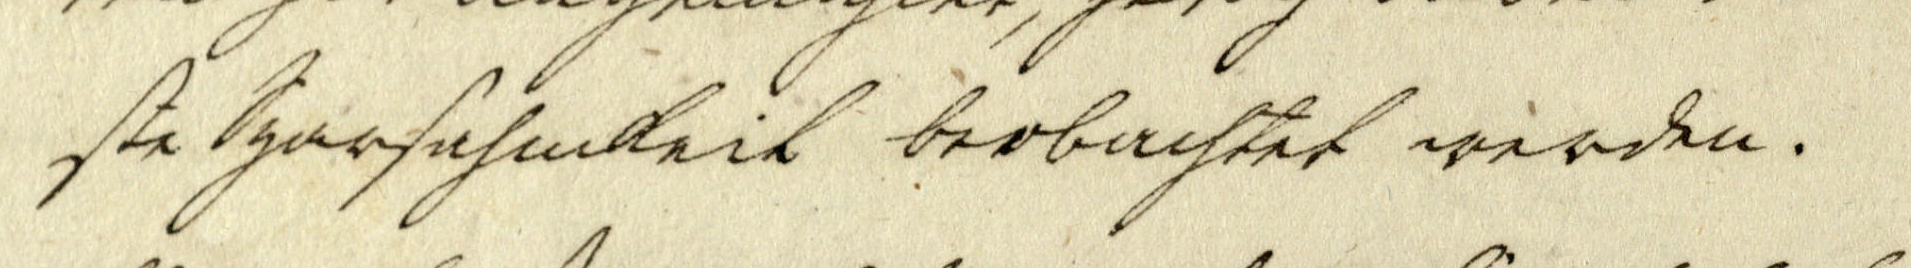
ste Sparsahmkeit beobachtet werden.
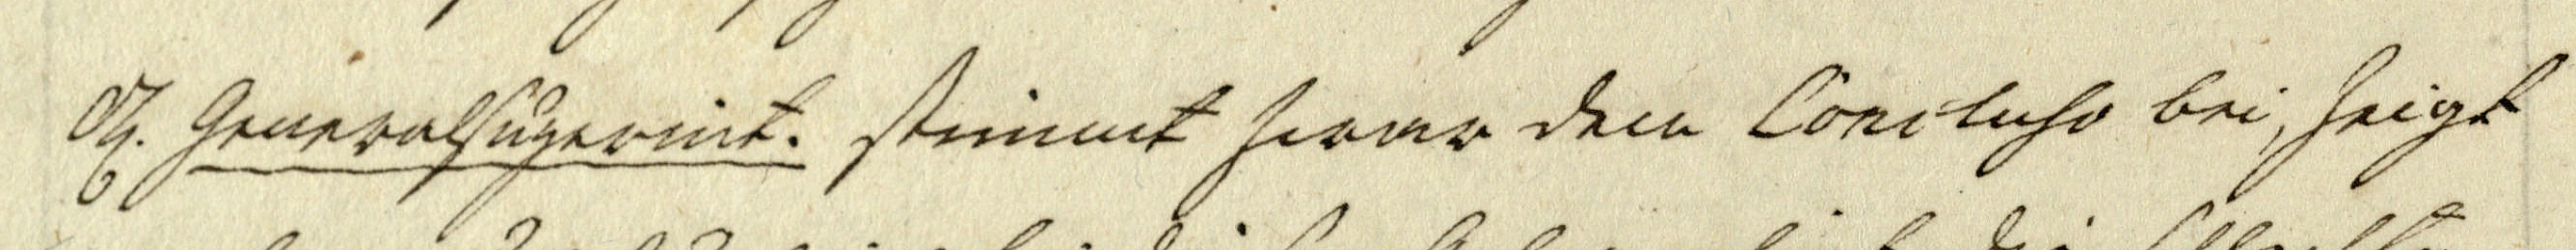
dh. Generalsuperint. stimmt zwar dem Concluso bei, zeigt
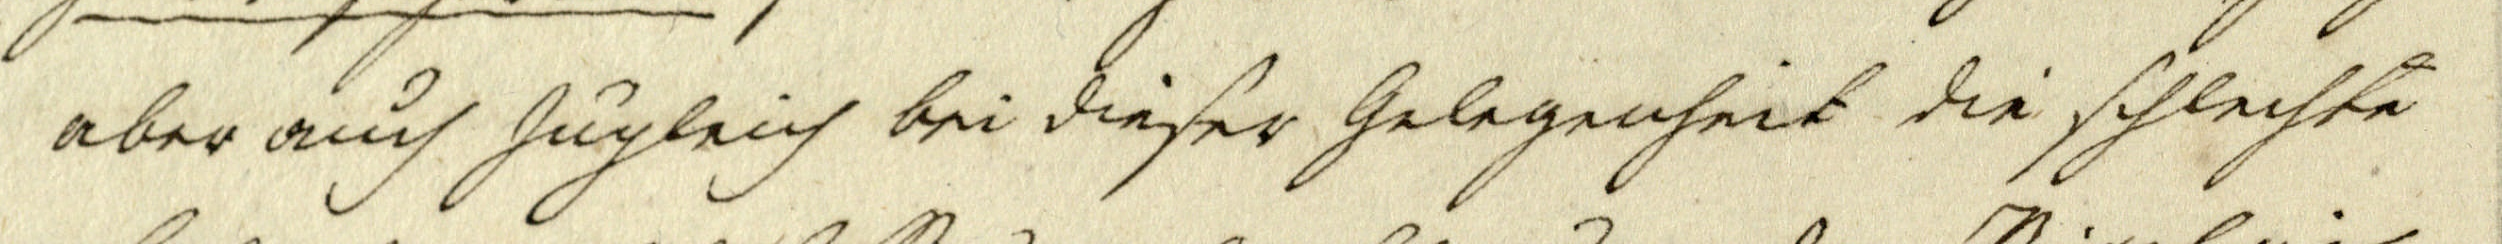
aber auch zugleich bei dieser Gelegenheit die schlechte
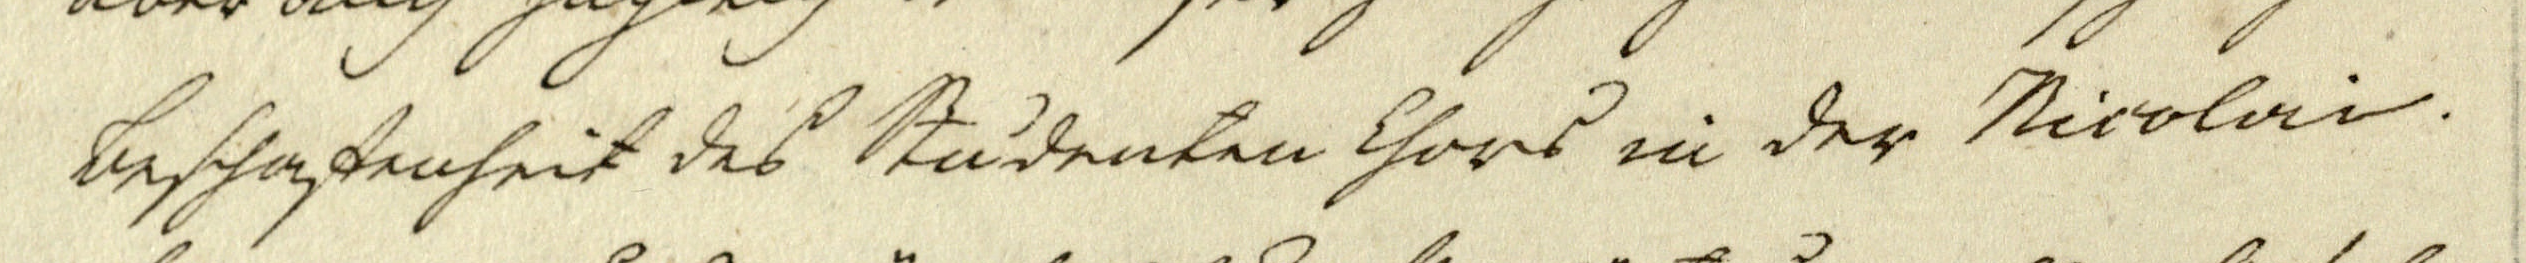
Beschaffenheit des Studenten Chors in der Nicolai¬
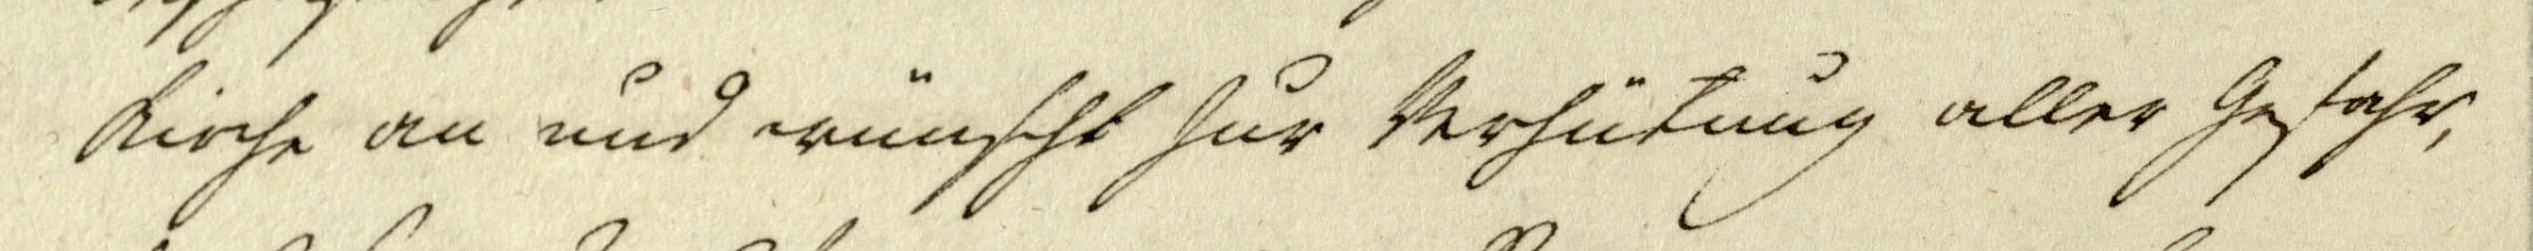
Kirche an und wünscht zur Verhütung aller Gefahr,
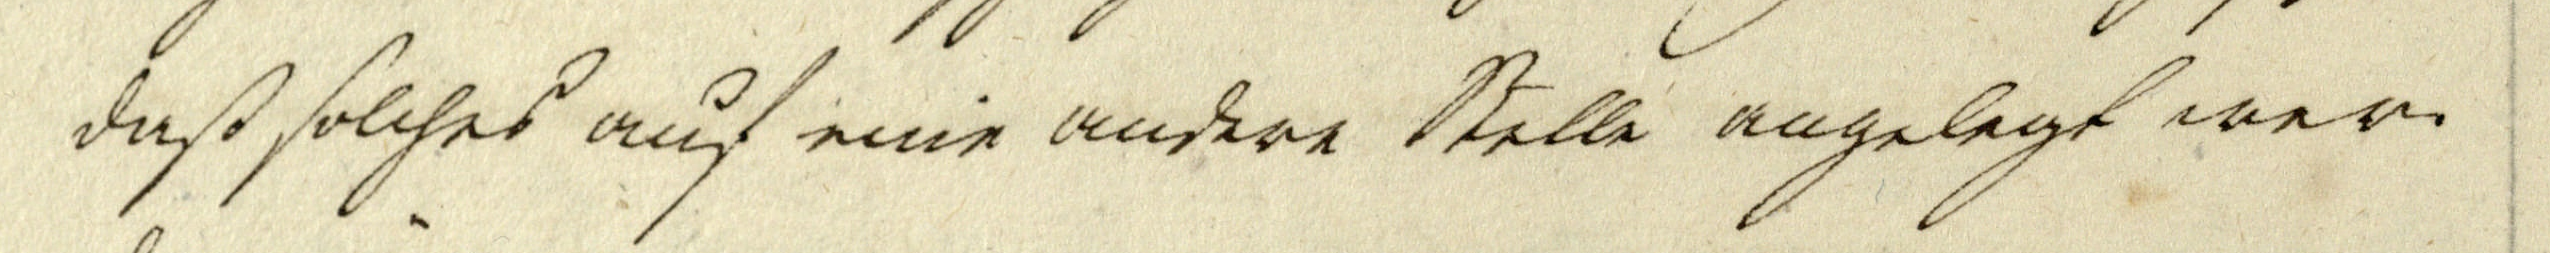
daß solches auf eine andere Stelle angelegt wer¬
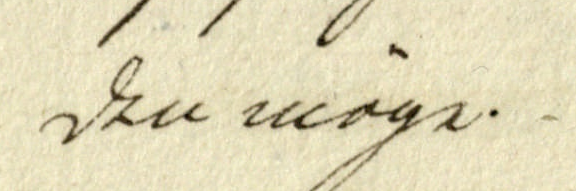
den möge.
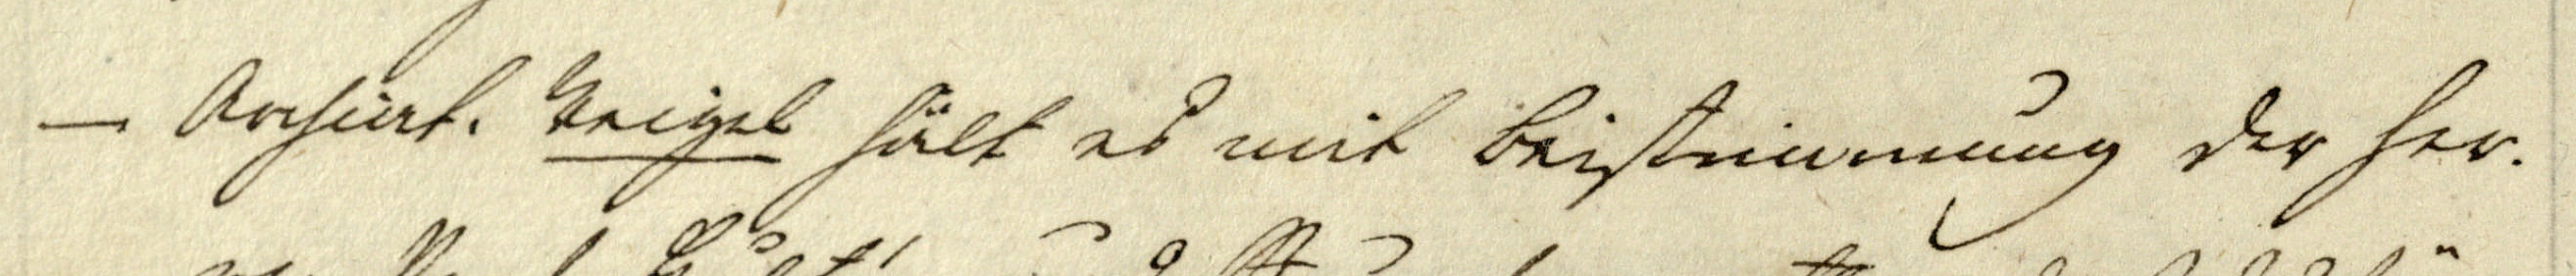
Archiat. Weigel hält es mit Beistimmung der Her¬
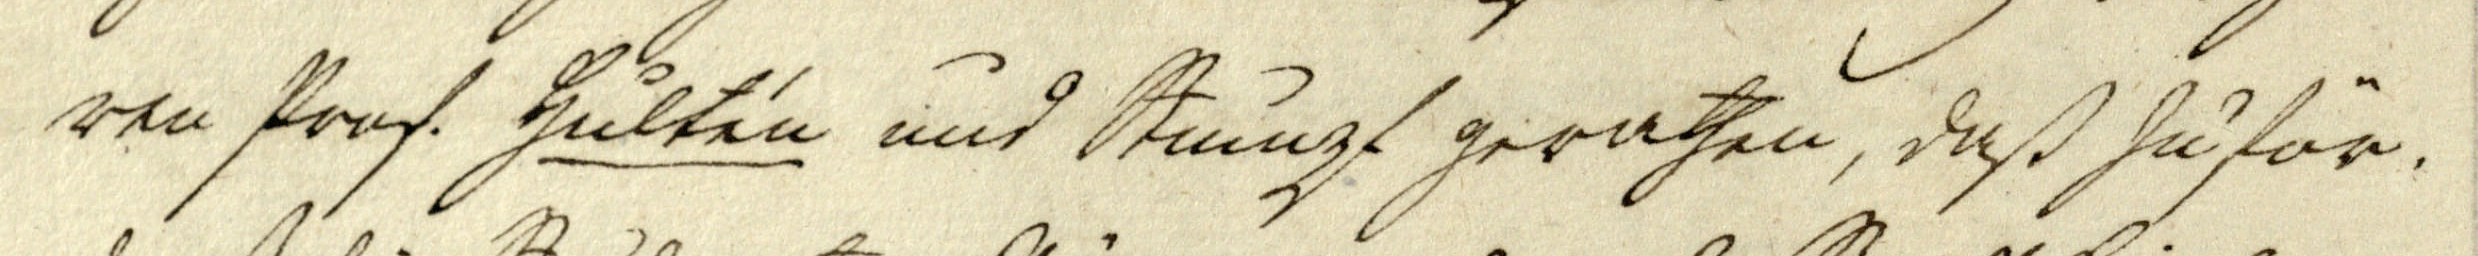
ren Prof. Hultén und Stumpf gerathen, daß zuför¬
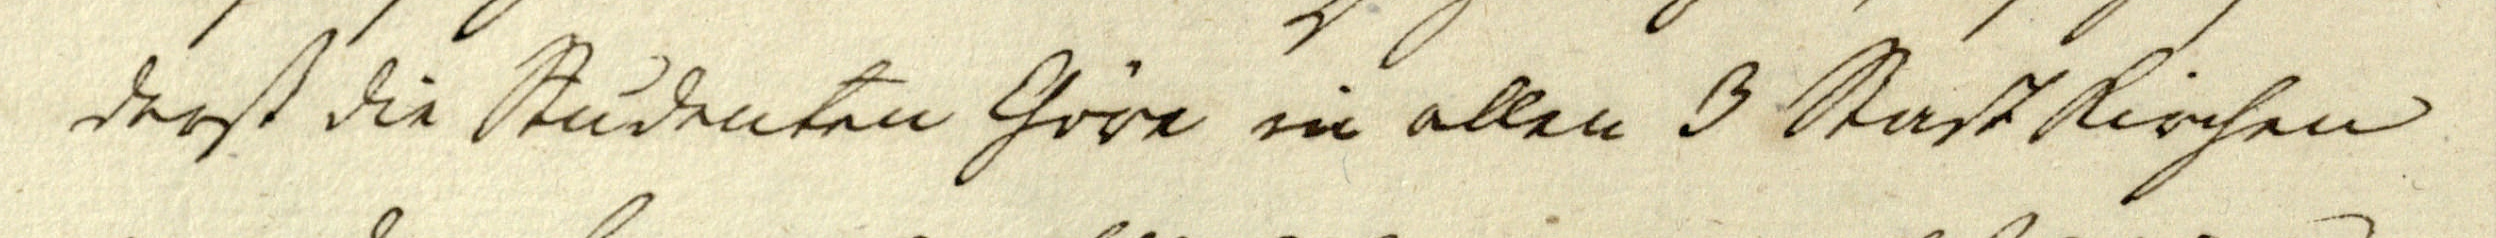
derst die Studenten Chöre in allen 3 StadtKirchen
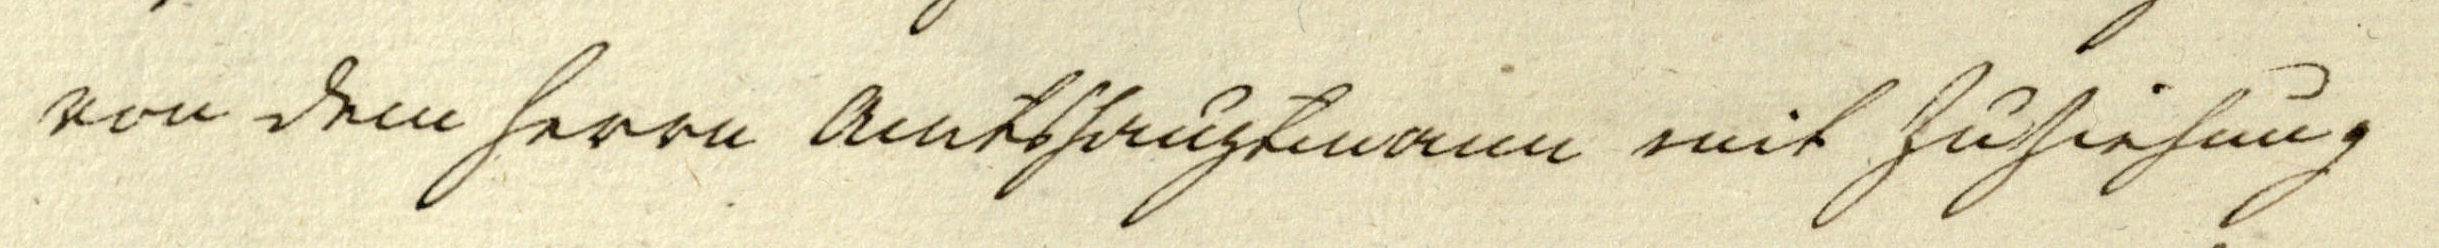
von dem Herrn Amtshauptmann mit Zuziehung
